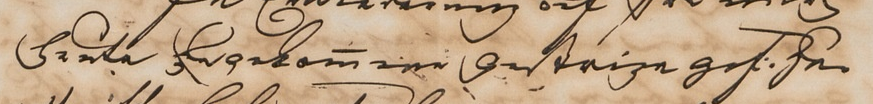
heute zugekommene gestrige gef. Zu-
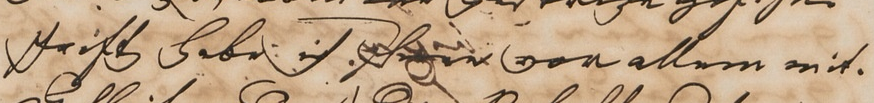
schrift habe ich Ihnen vor allem mit-
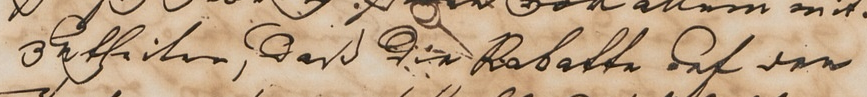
zutheilen, daß die Rabatte auf den
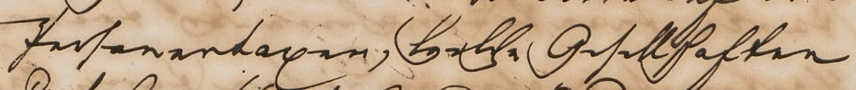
Personentaxen, welche Gesellschaften
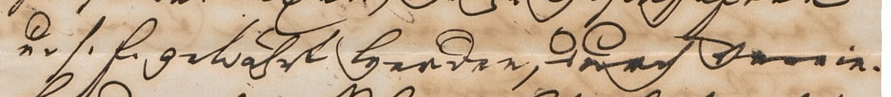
u. s. f. gewährt werden, durch Verein-
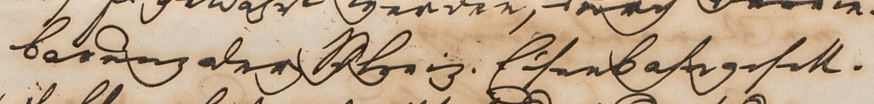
barung der Schweiz. Eisenbahngesell-
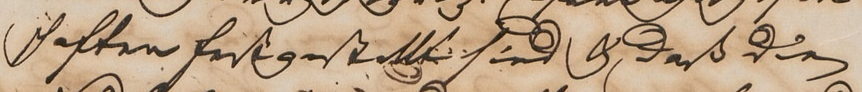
schaften festgestellt sind & daß die
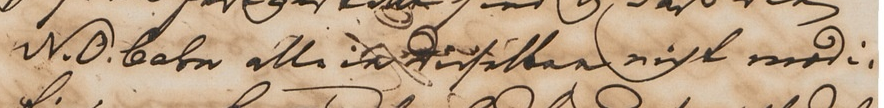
N.O.bahn allein dieselben nicht modi-
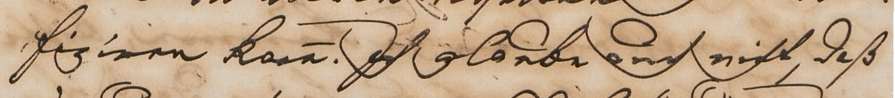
fiziren kann. Ich glaube auch nicht, daß
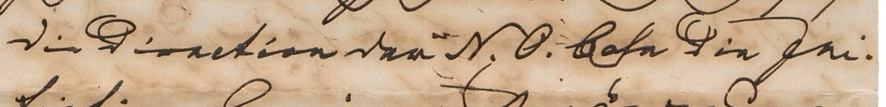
die Direction der N.O.bahn die Ini-
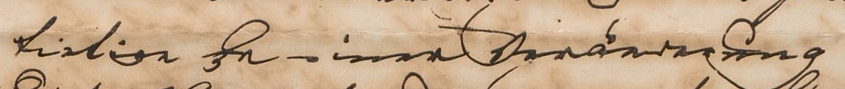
tiative zu einer Veränderung
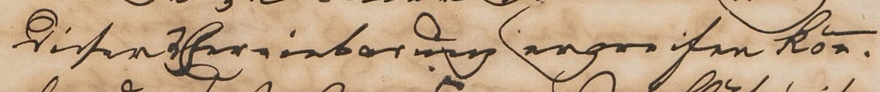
dieser Vereinbarung ergreifen könn-
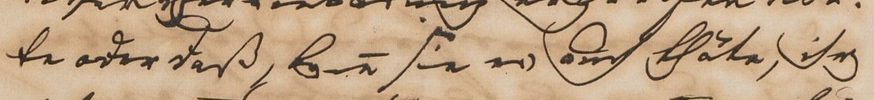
te oder daß, wenn sie es auch thäte, ihr
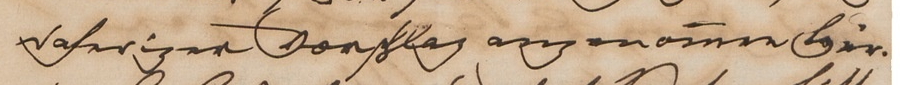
daheriger Vorschlag angenommen wür-
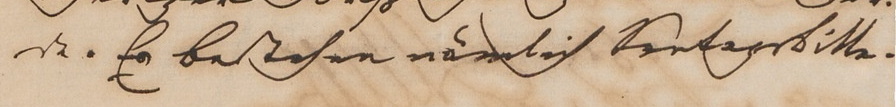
de. Es bestehen nämlich Sontagsbille-
